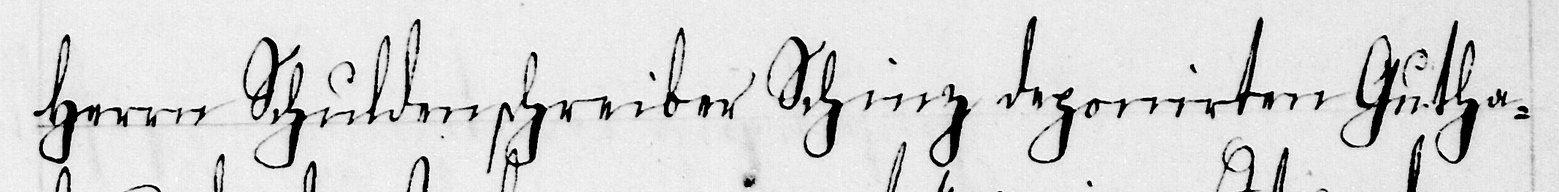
Herrn Schuldenschreiber Schinz deponirten Gutha¬
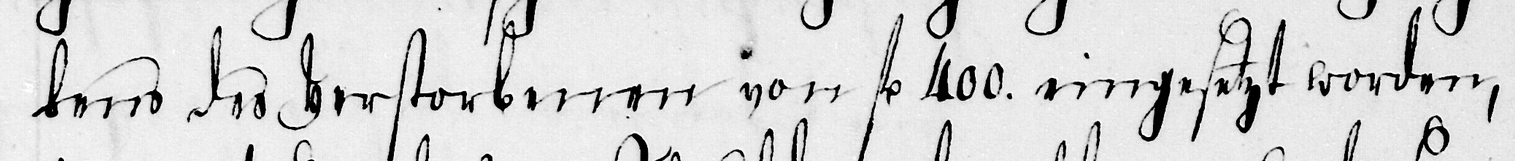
bens des Verstorbenen von fl. 400. eingesetzt worden,
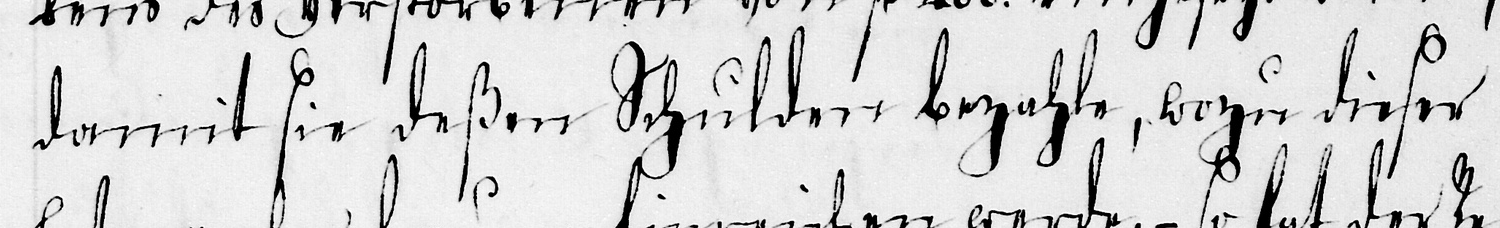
damit sie deßen Schulden bezahle, wozu dieser
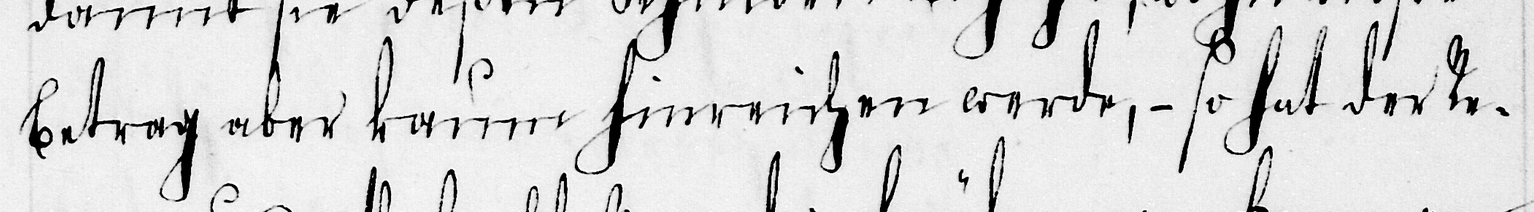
Betrag aber kaum hinreichen werde, – so hat der Re¬
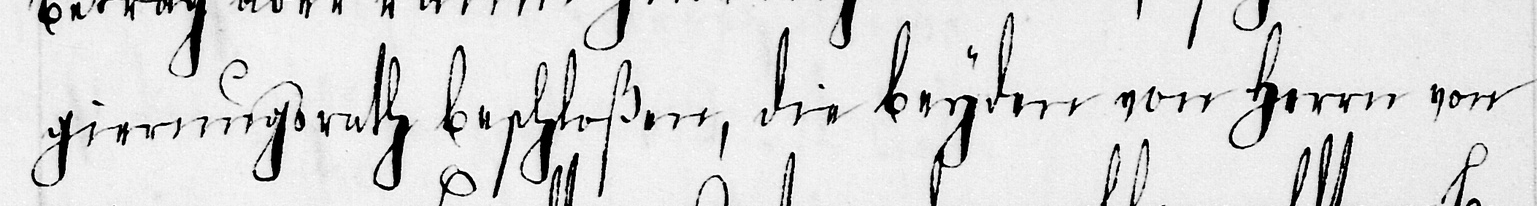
gierungsrath beschloßen, die beyden von Herrn von
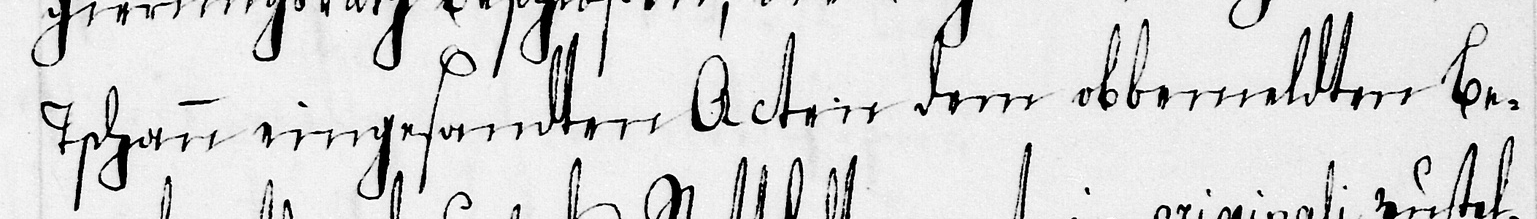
Tschann eingesandten Acten dem obbemeldten Be¬
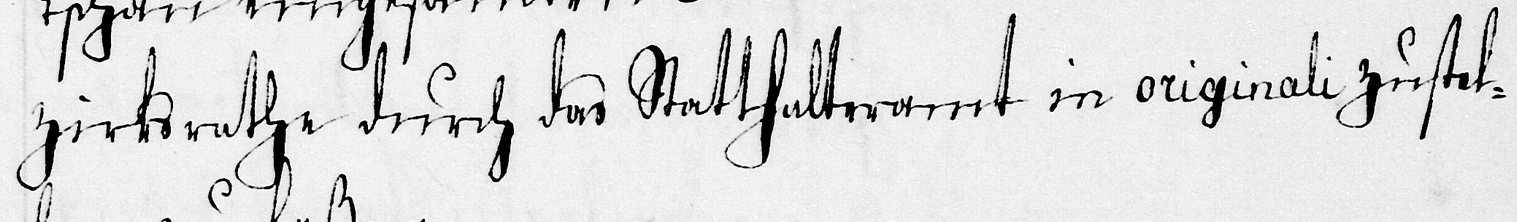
zirksrathe durch das Statthalteramt in originali zustel¬
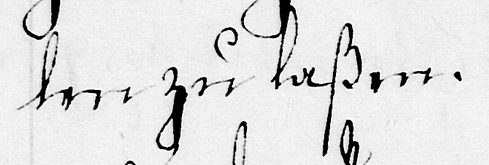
len zu laßen.
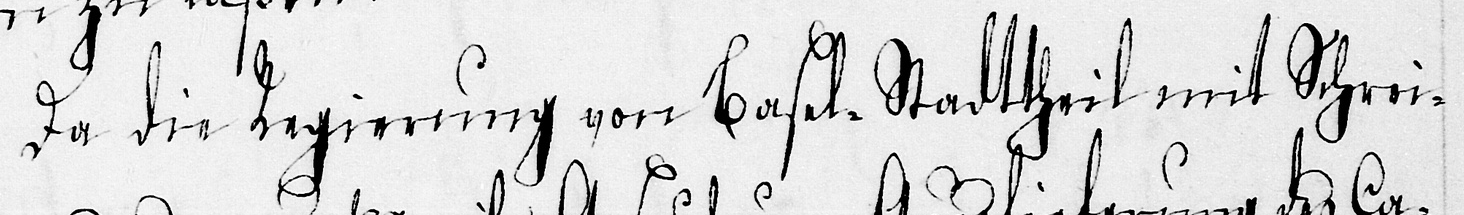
Da die Regierung von Basel-Stadttheil mit Schrei¬
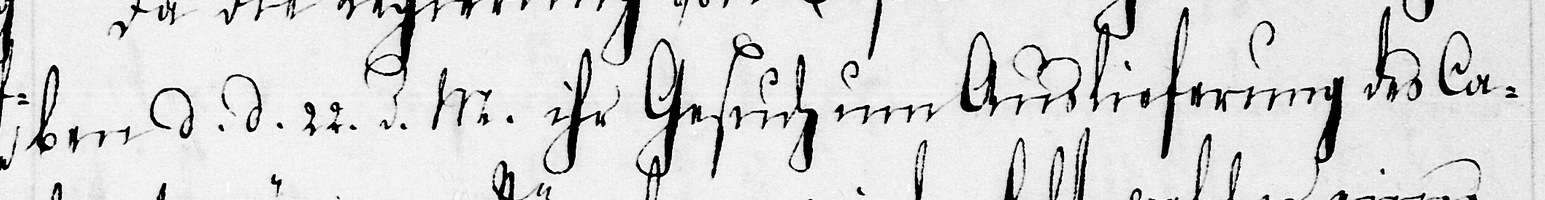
ben d. d. 22. d. M. ihr Gesuch um Auslieferung des Ca¬
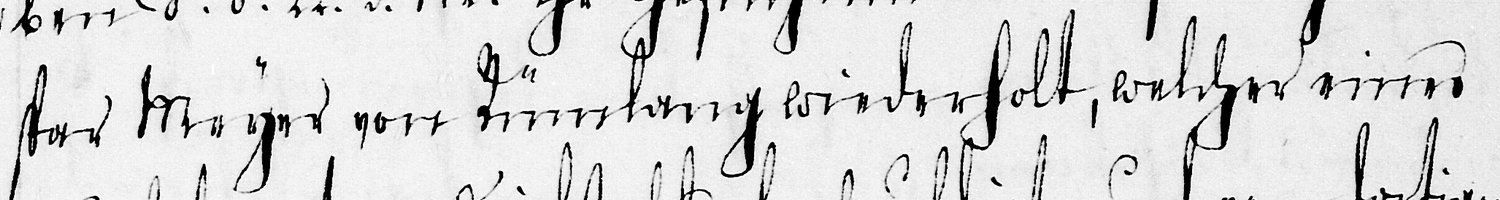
spar Meyer von Rümlang wiederholt, welcher eines
